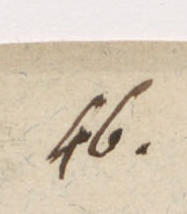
46.
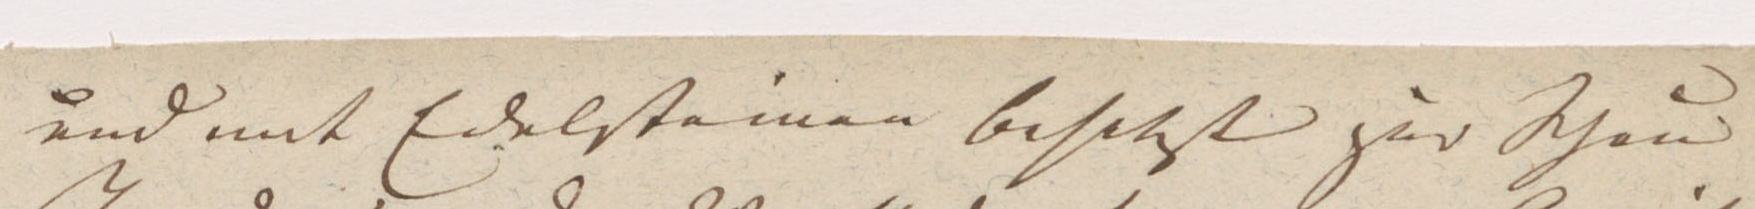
und mit Edelsteinen besetzt zur Schau
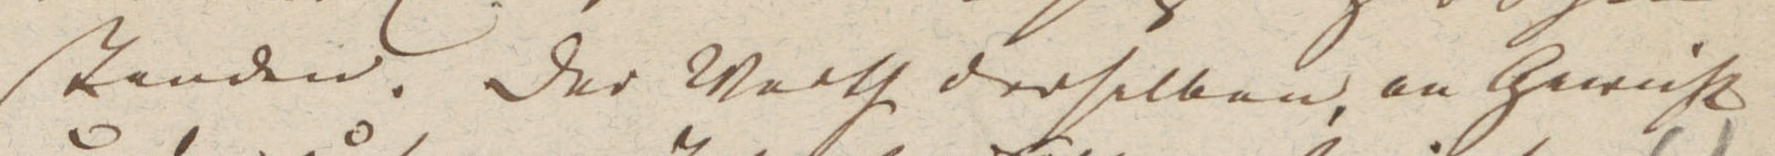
standen. Der Werth derselben, an Gewicht
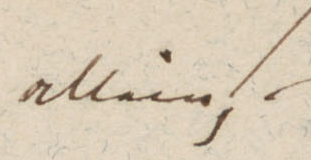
allein,
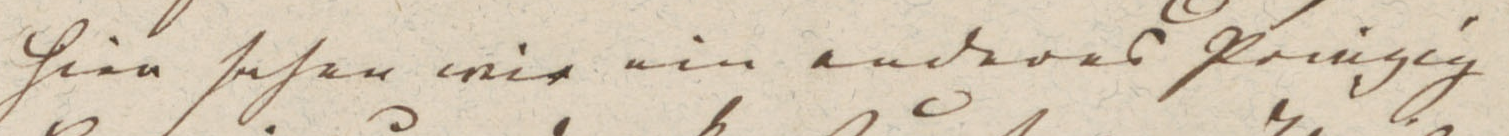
Hier sehen wir ein anderes Prinzip
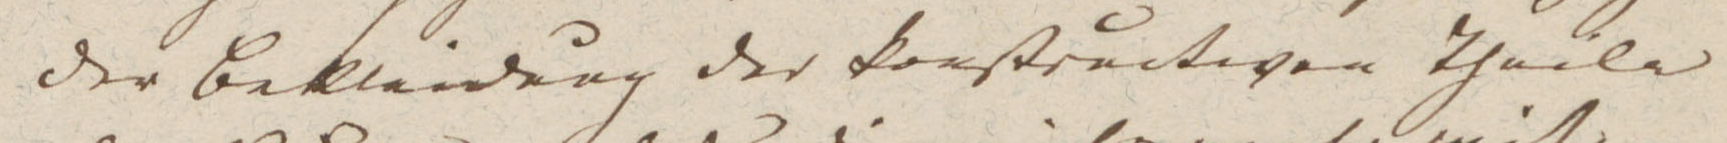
der Bekleidung der konstructiven Theile
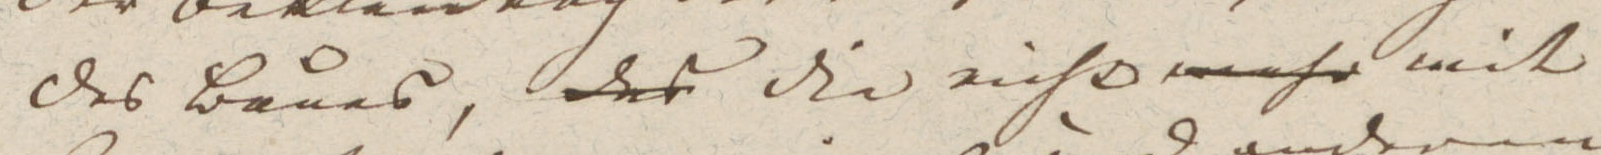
des Baues, das die nicht mehr mit
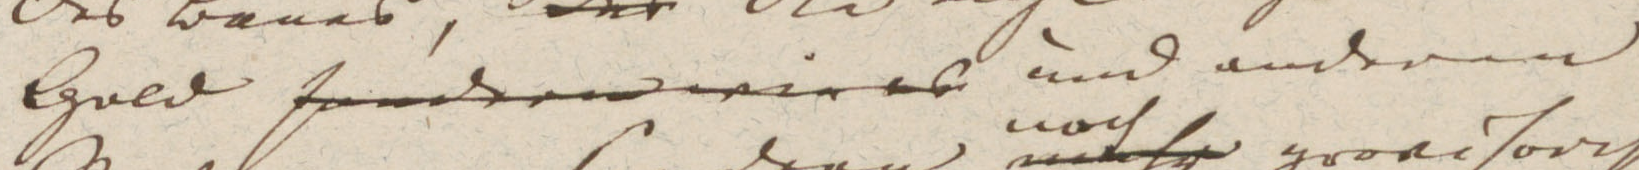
Gold sondern wie es und anderen
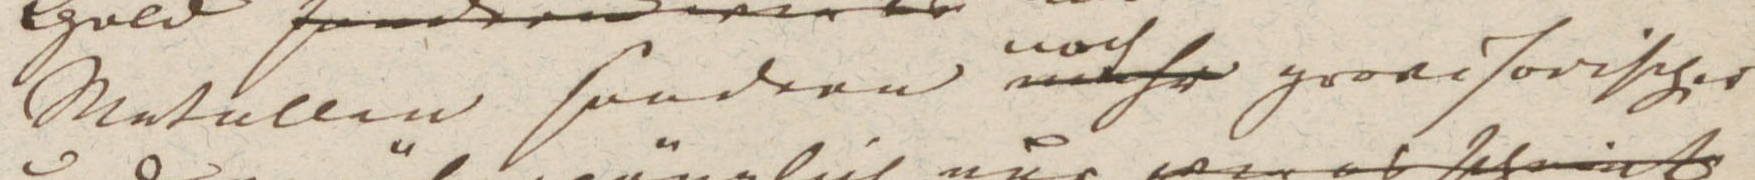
Metallen sondern mehr noch provisorischer
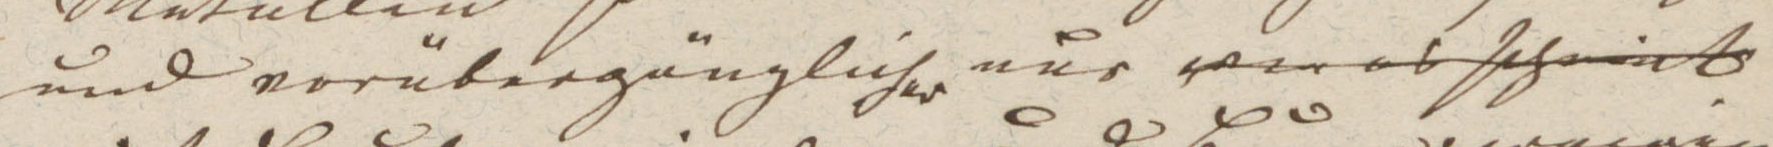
und vorübergänglicher nur wie es scheint
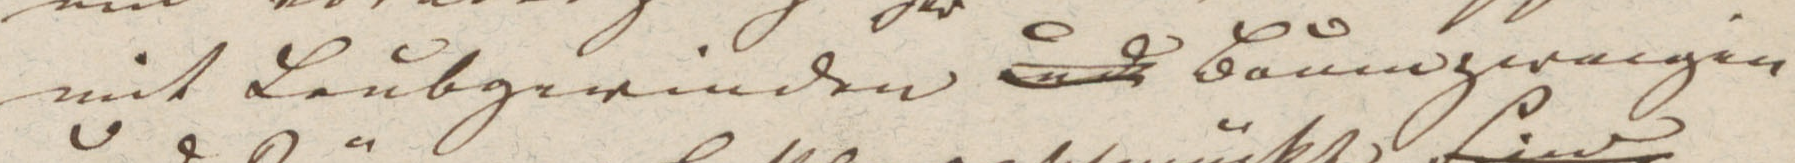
mit Laubgewinden und Baumzweigen
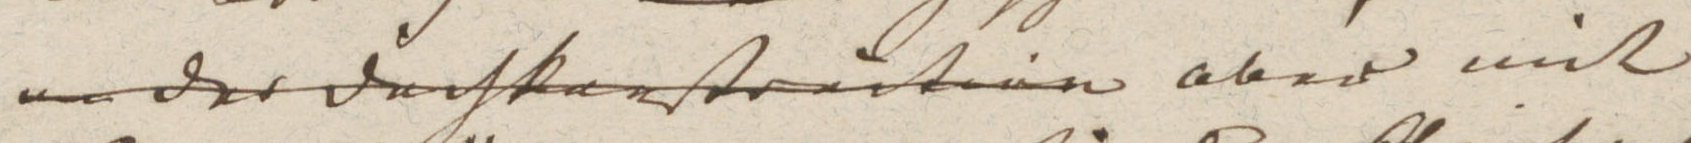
an der Dachkonstruction aber mit
